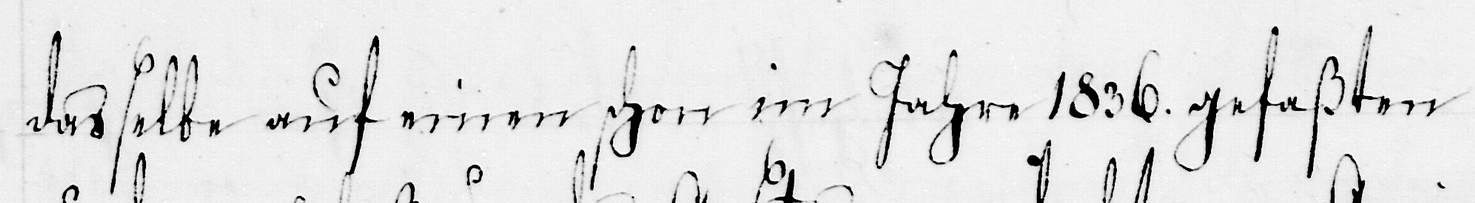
dasselbe auf einen schon im Jahre 1836. gefaßten
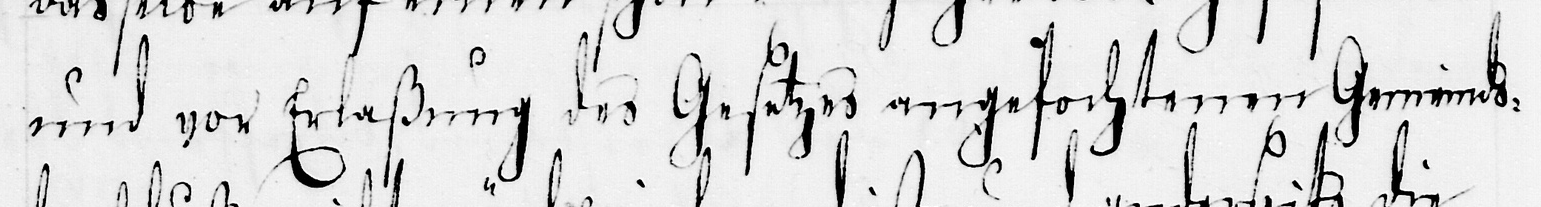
und vor Erlaßung des Gesetzes angefochtenen Gemeinds¬
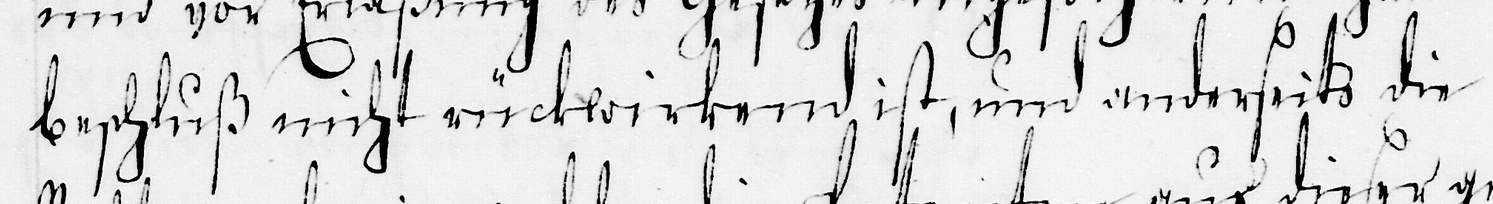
beschluß nicht rückwirkend ist, und anderseits die
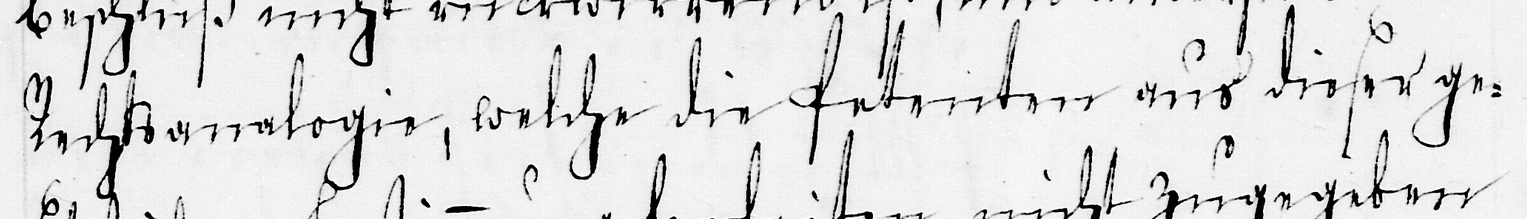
Rechtsanalogie, welche die Petenten aus dieser ge¬
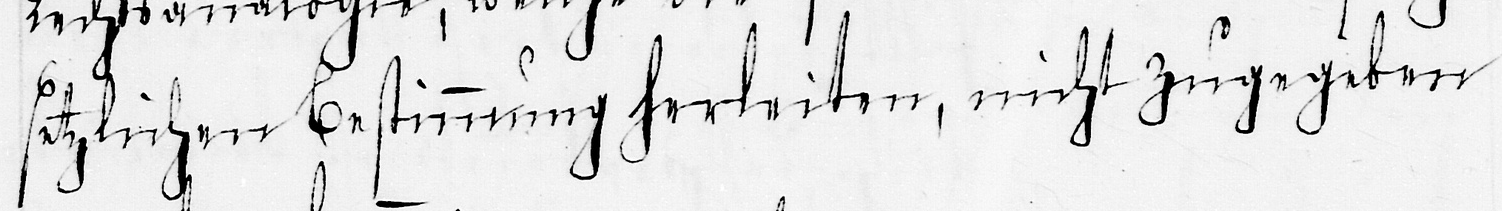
setzlichen Bestimmung herleiten, nicht zugegeben
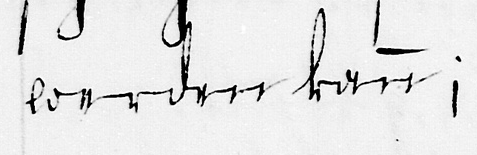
werden kann;
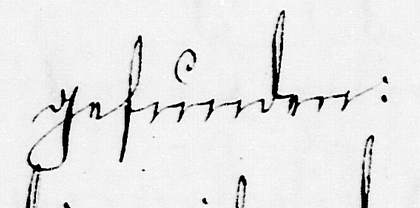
gefunden:
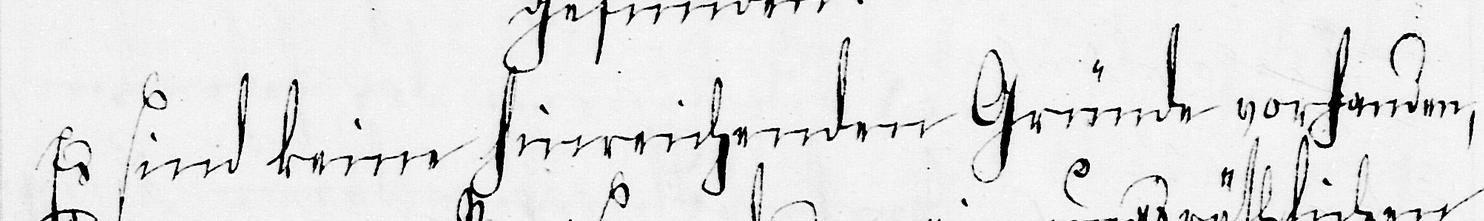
Es sind keine hinreichenden Gründe vorhanden,
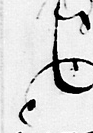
1.
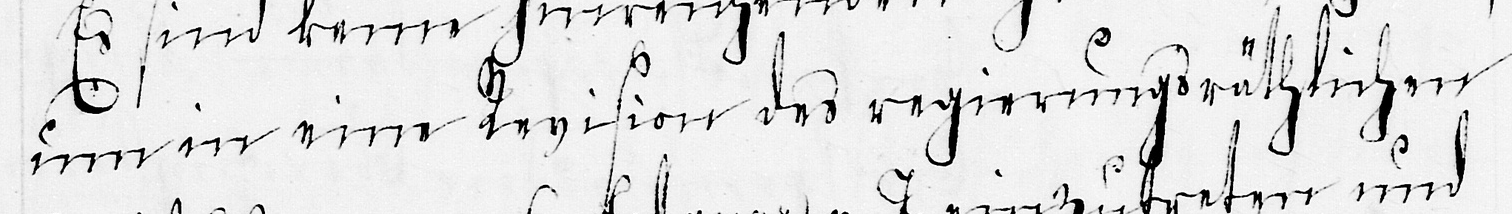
um in eine Revision des regierungsräthlichen
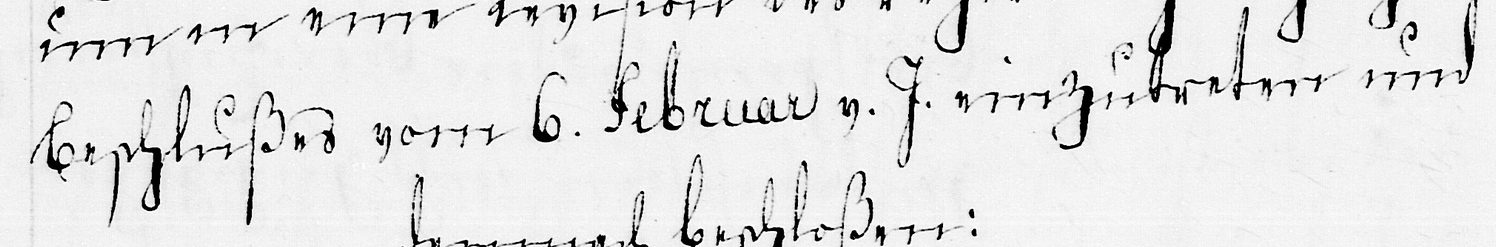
Beschlußes vom 6. Februar v. J. einzutreten und
